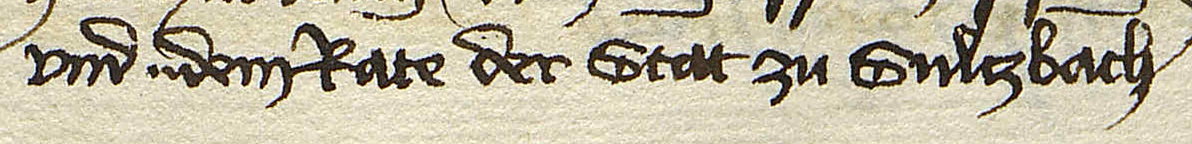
vnd ~ dem Rate der Stat ʒu Sulʒbach
